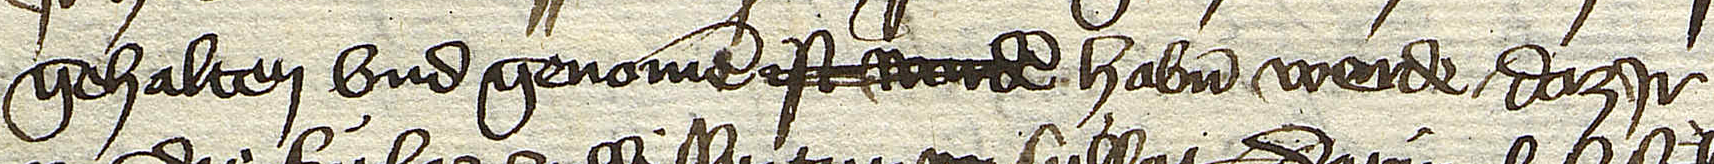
gehalten vnd genome* iſt worde* hab*n werde / daʒ Ir
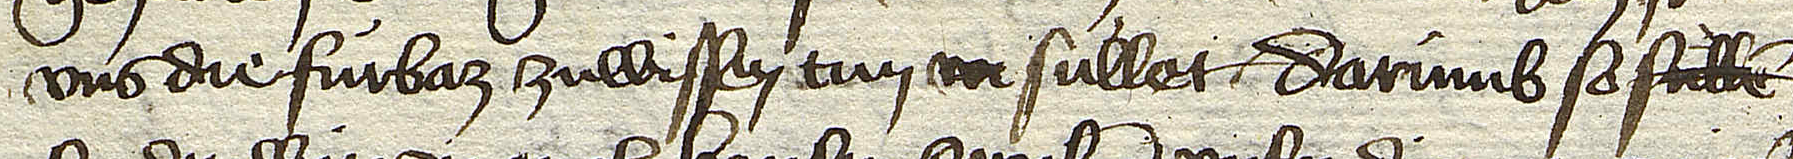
vns die fürbaʒ cʒuwiſſen tun wi ſüllet / darümb ſo ſülle*
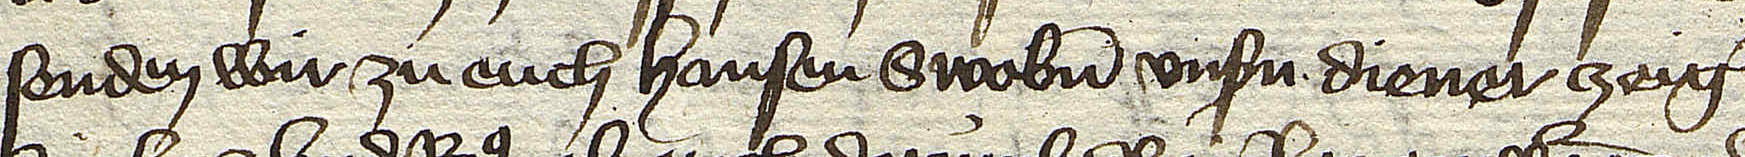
ſenden wir cʒu euch Hanſen Swob*n vnſ*n . diener cʒeig*
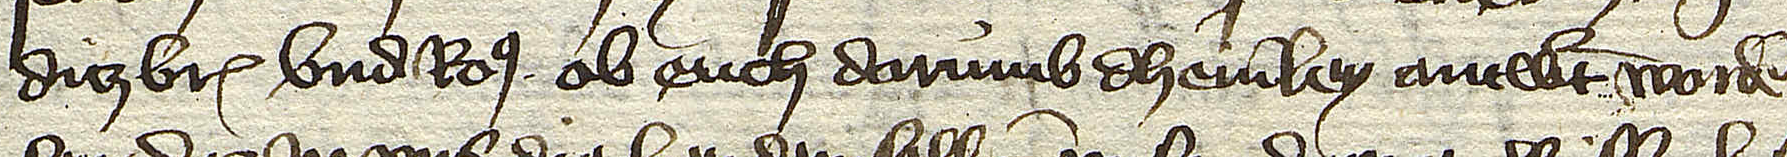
dicʒ br* vnd Ro* . ob euch darümb dhein*ley antw*t worde*
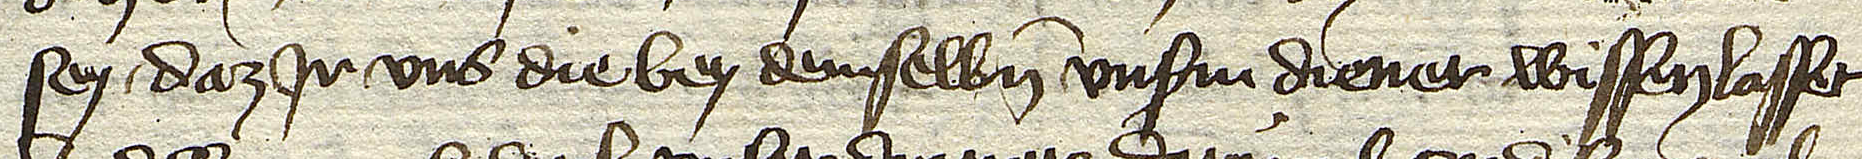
ſey / daʒ Ir vns die bey demſelb*n vnſ*m diener wiſſen laſſet
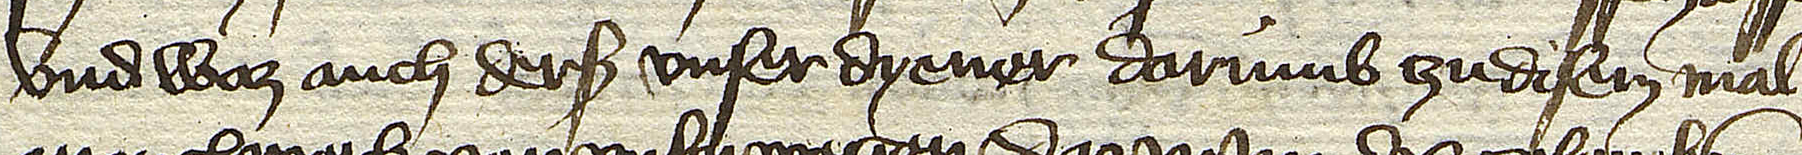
Vnd waʒ auch derſ* vnſer dyener darümb cʒu diſem mal
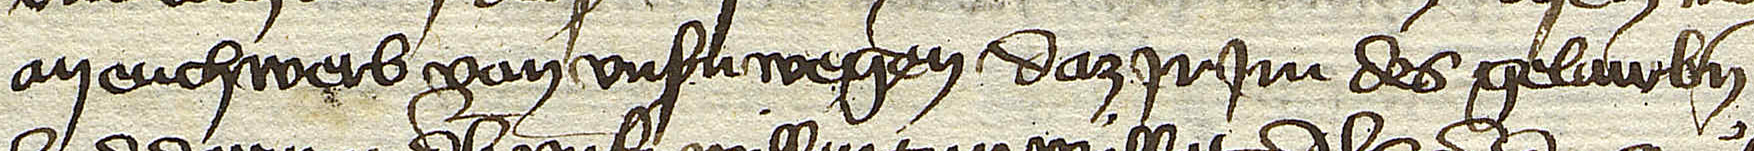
an euch werb von vnſ*n wegen / daʒ Ir Im des gelawb*n
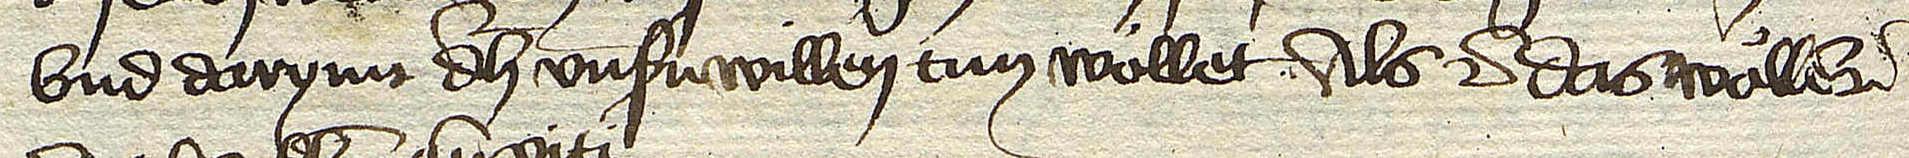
vnd darynn d*h* vnſ*n willen tun wöllet . Als ec* das wöllen ec*
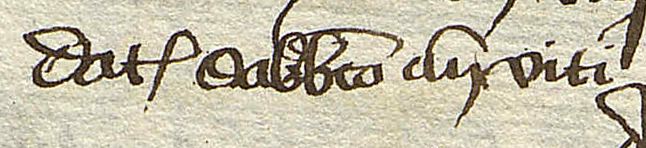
Dat* Sabbto* an* viti*
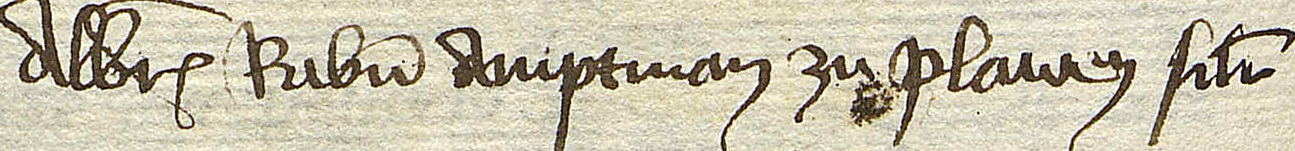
Albr* Rab*n Amptman ʒu Plawen ſilr*
